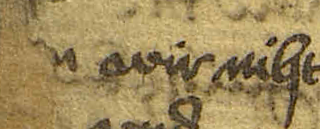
% wir niht
